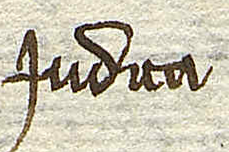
Iudica
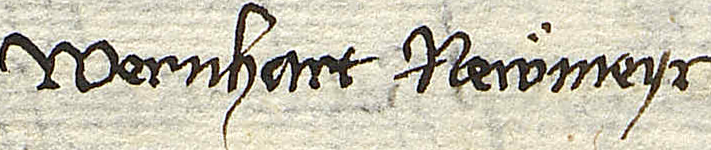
Wernhart Newmeyr
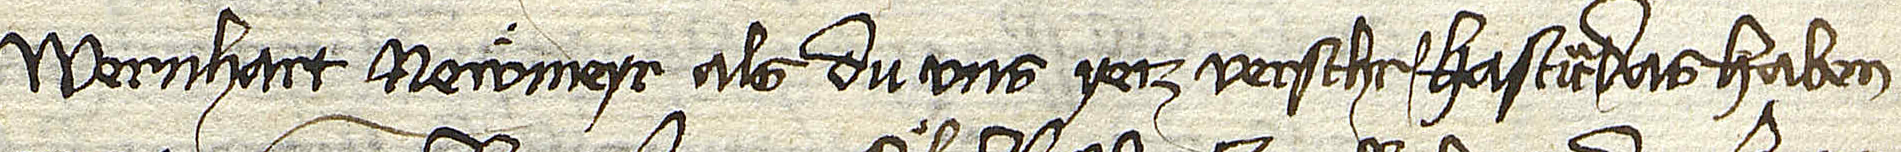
Wernhart Newmeyr als du vns yecʒ verſchr* haſt ec* das haben
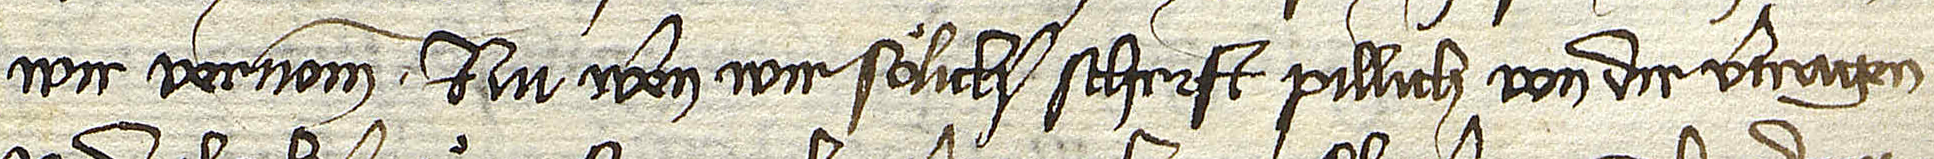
wir vernom* . Nu we*n wir ſölich ſchrift pillich von dir v*tragen
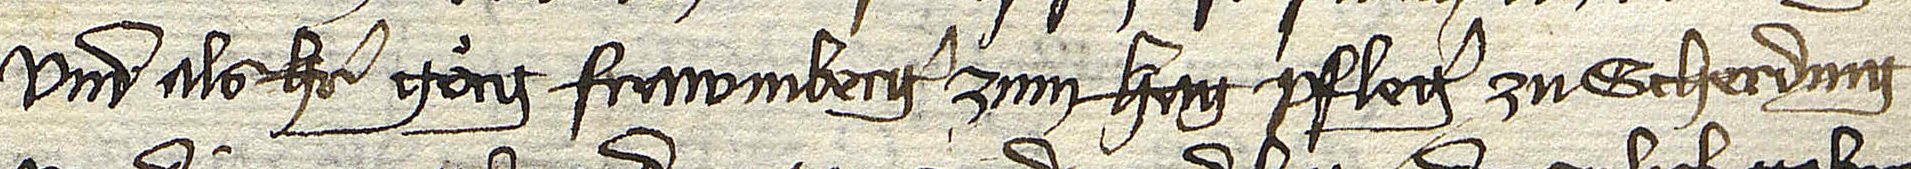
Vnd als h*r görg frawmberg* ʒum hag pfleg* ʒu Scherding
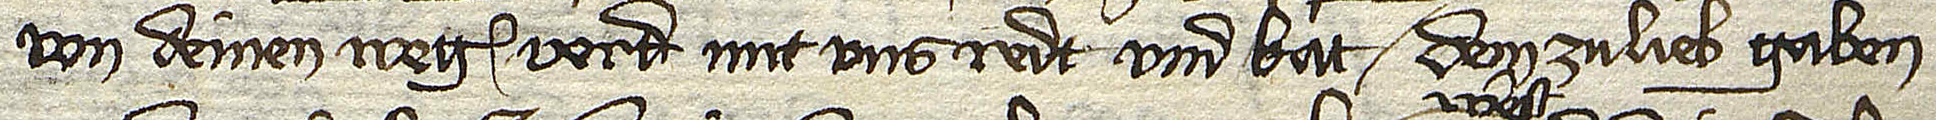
von deinen weg* verd mit vns redt vnd bat / dem ʒulieb gaben
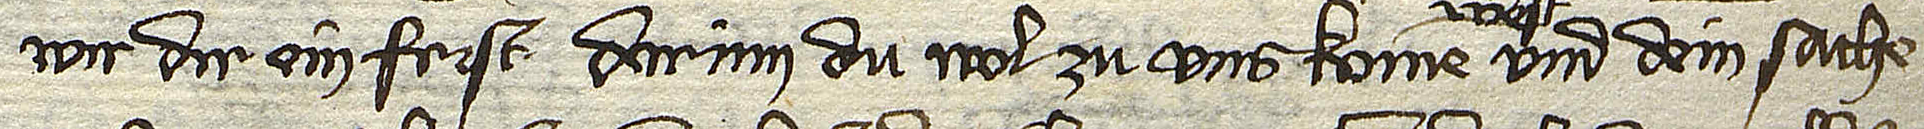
wir dir ein friſt . Darinn du wol ʒu vns kome* vnd dein ſache
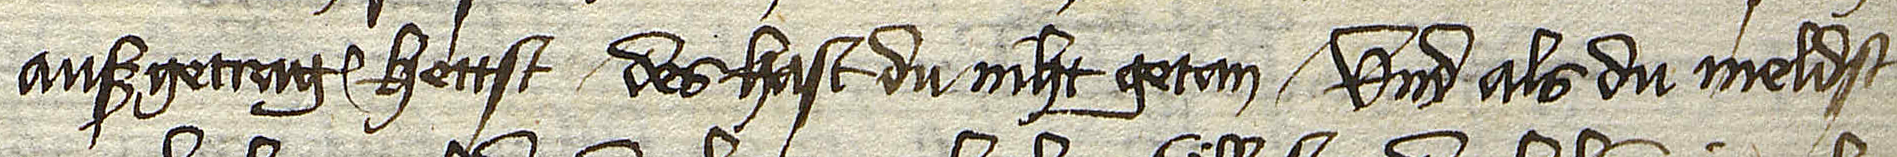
auſʒgetrag* hettſt / des haſt du niht getan / Vnd als du meldſt
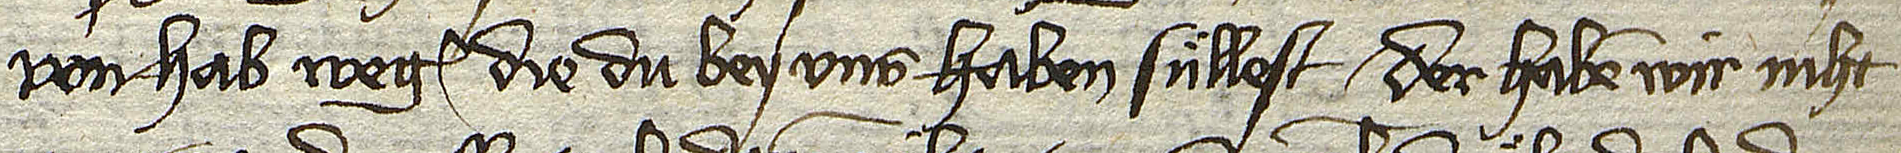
von hab weg* die du bey vns haben ſülleſt / Der habe* wir niht
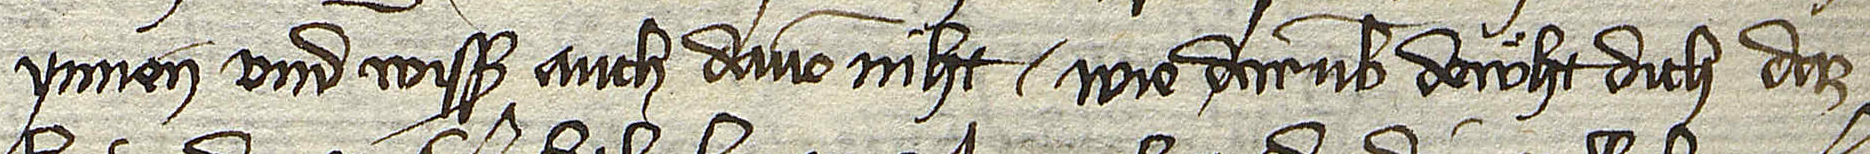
ynnen vnd wiſſ* auch dauo* niht / wie daru*b dewht dich daʒ
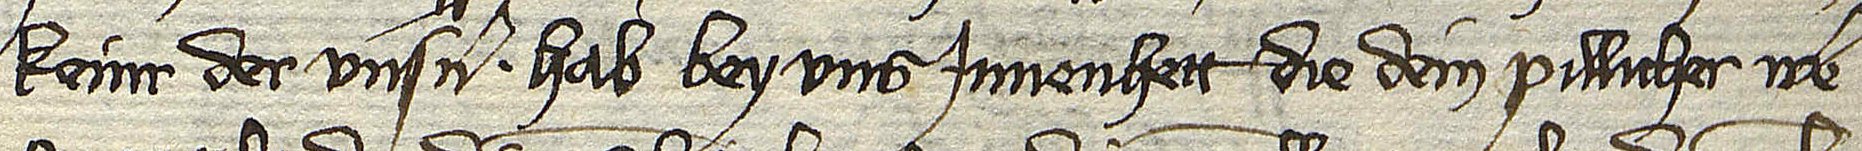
keinr der vnſ*n . hab bey vns Innenhett / die dein pillicher we*
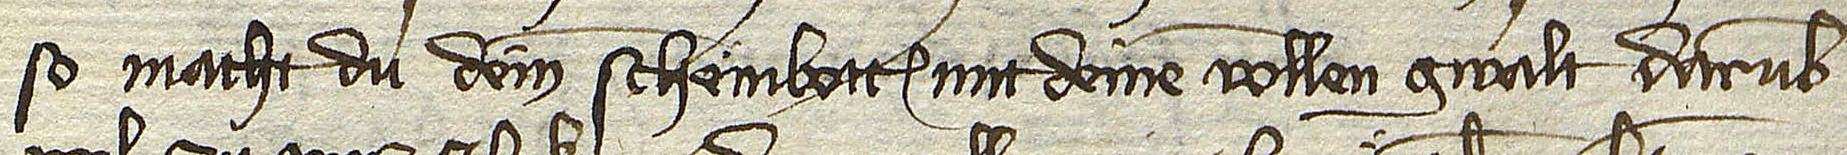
ſo macht du dein ſcheinbott* mit deine* vollen gwalt daru*b
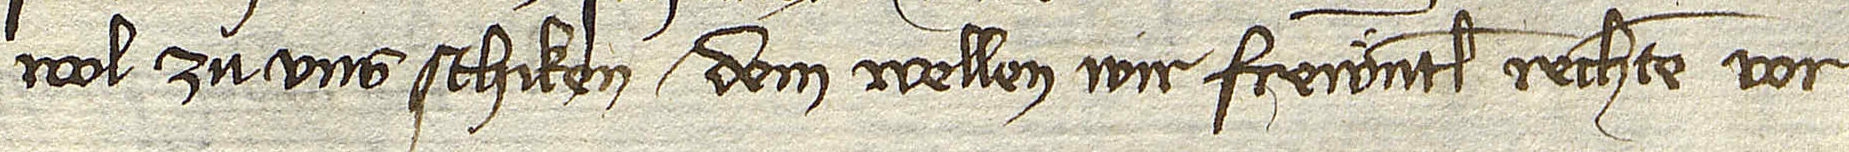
wol ʒu vns ſchiken / dem wellen wir frewntl* rechte* vor
